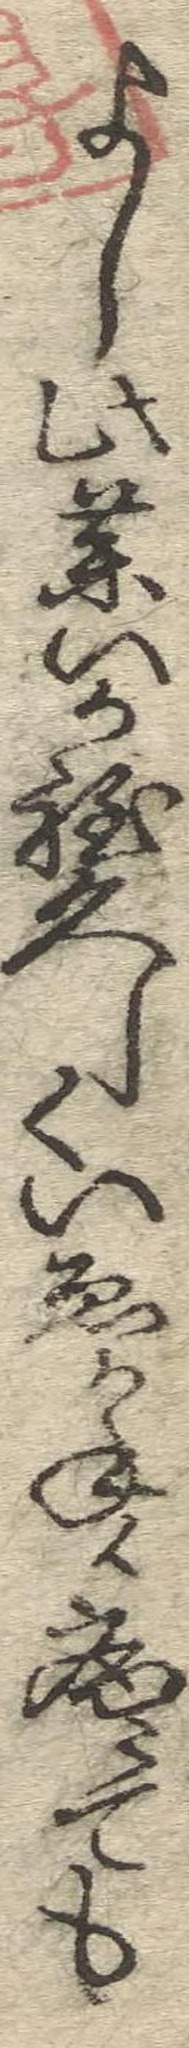よし此薬いか程久しくいゑかねる病にても
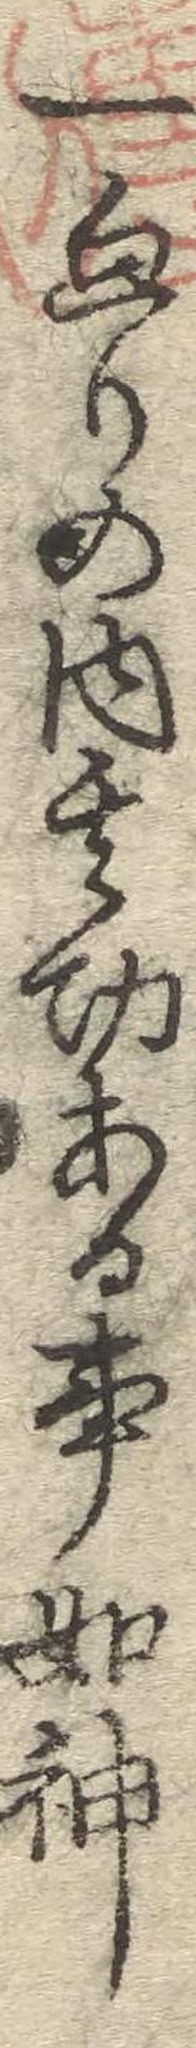一廻りの内其功ある事如神
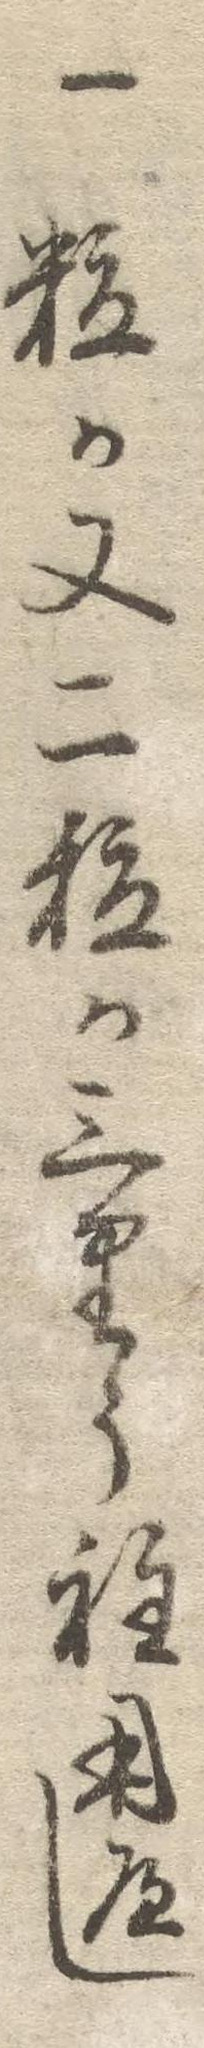一粒か又二粒か三りう程用へし
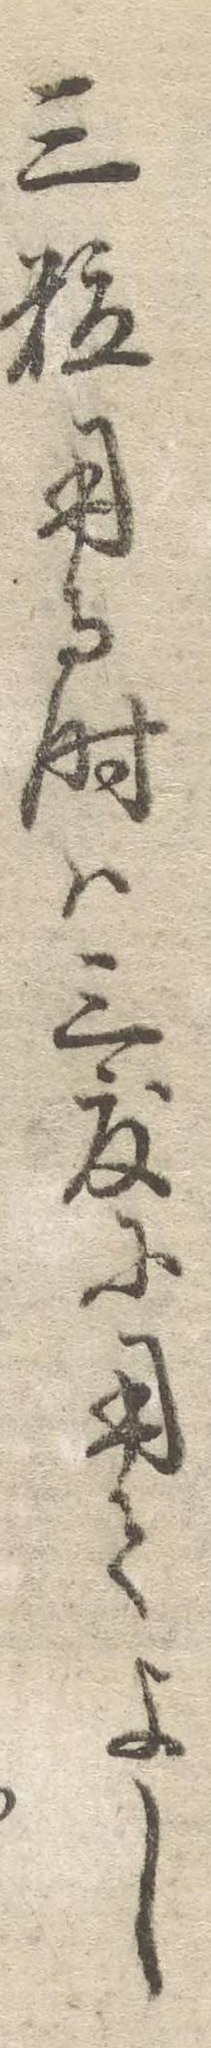三粒用る時は三度に用てよし
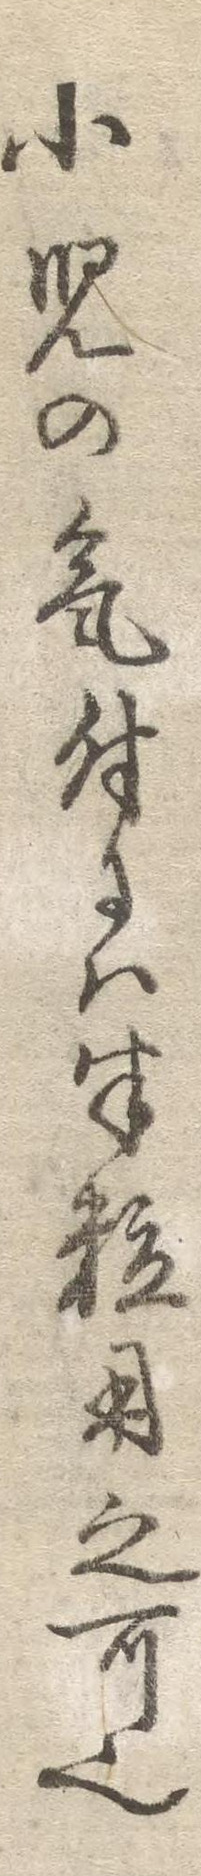小児の気付には半粒用之可也
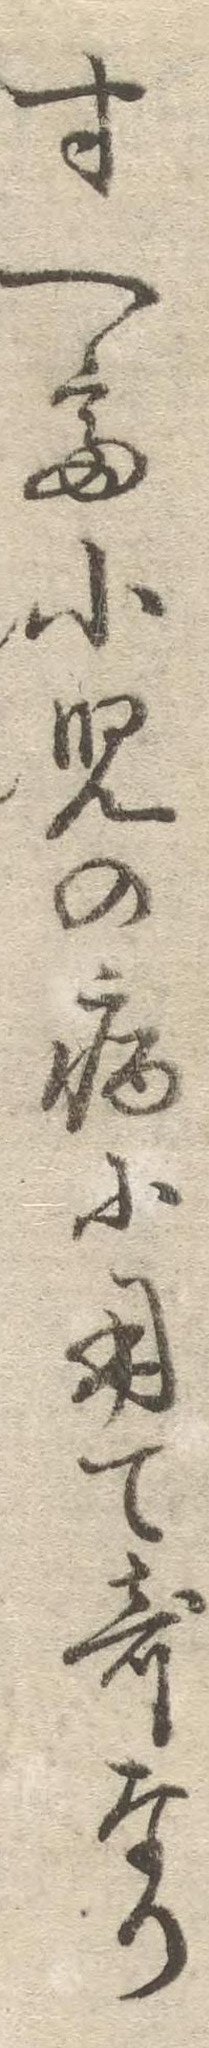すへて小児の病に用て奇なり
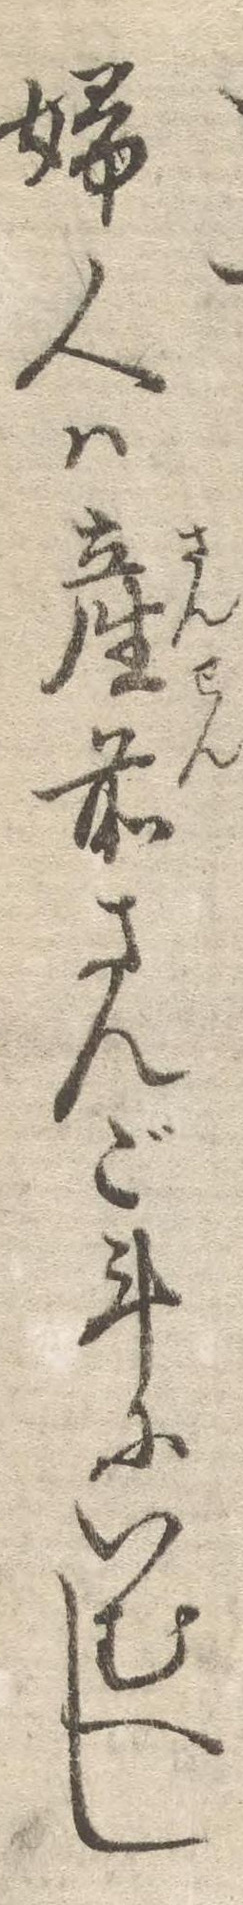婦人は産前さんご斗にいむへし
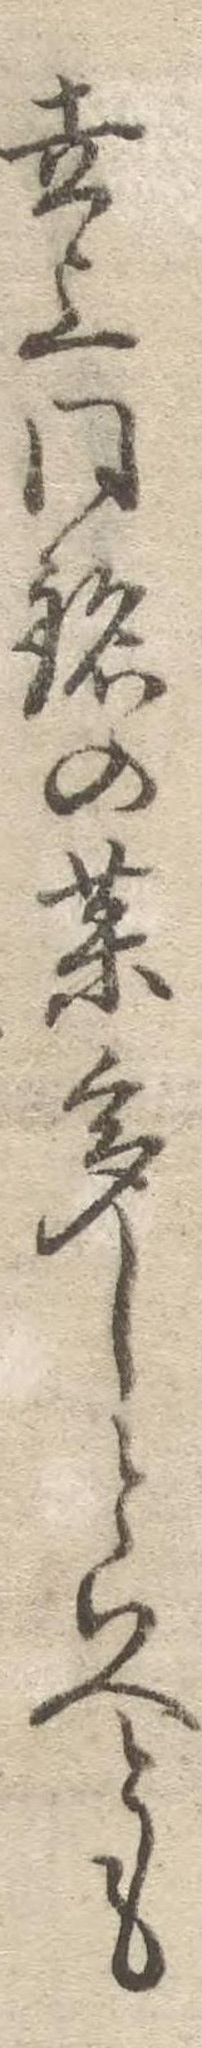世上同銘の薬多しといへとも
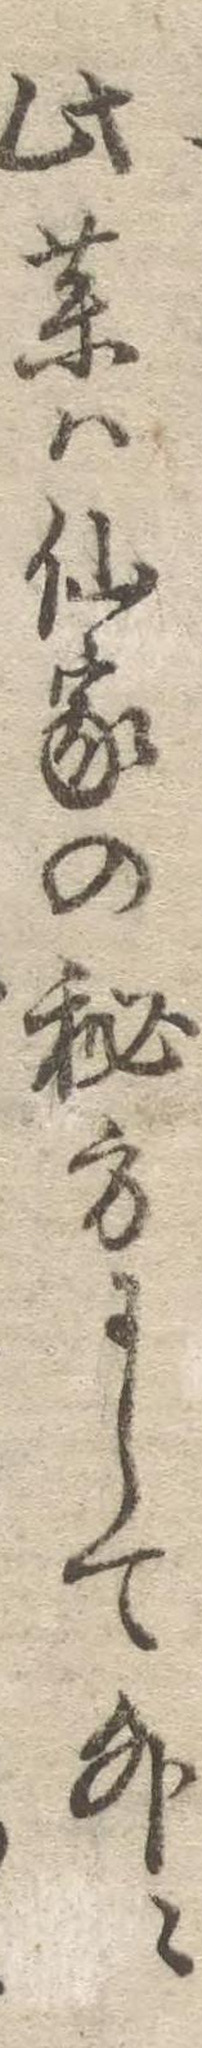此薬は仙家の秘方にして外に
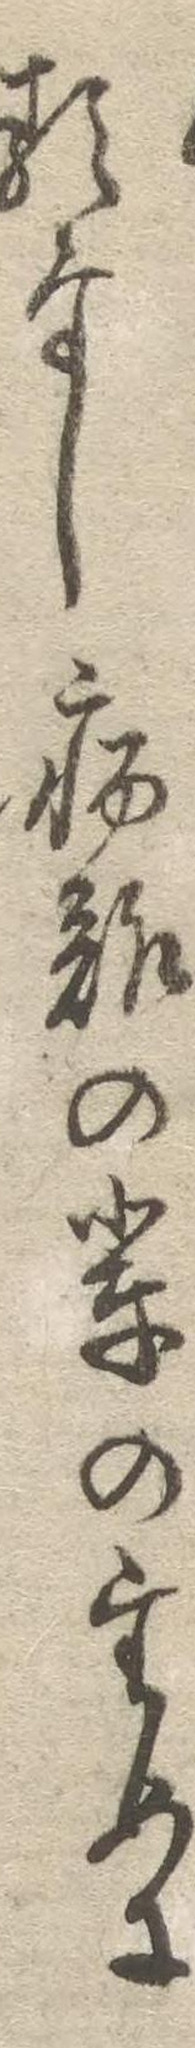類なし病難の輩のために
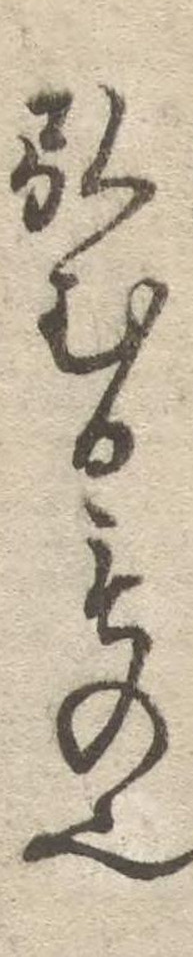弘むるもの也
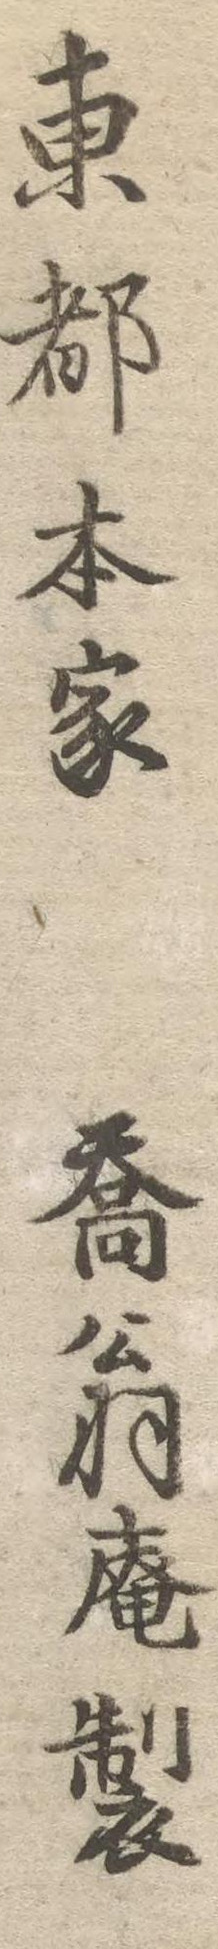東都本家喬翁庵製

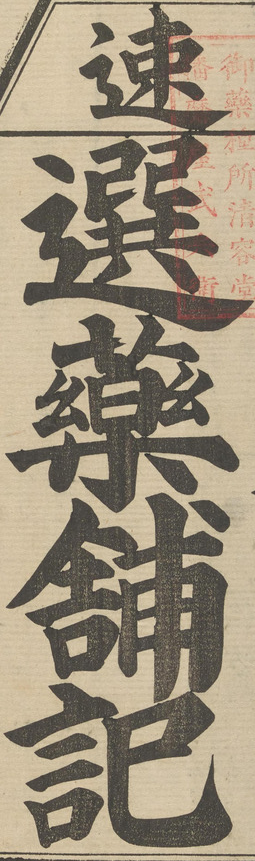選薬舗記
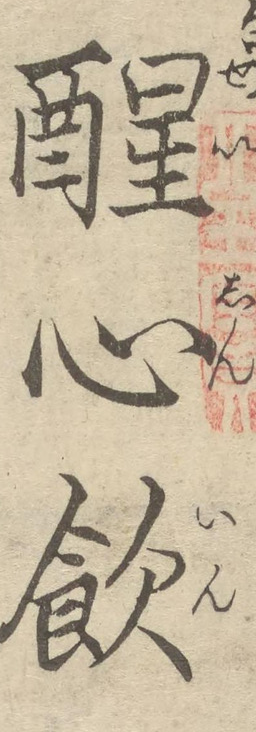醒心飲
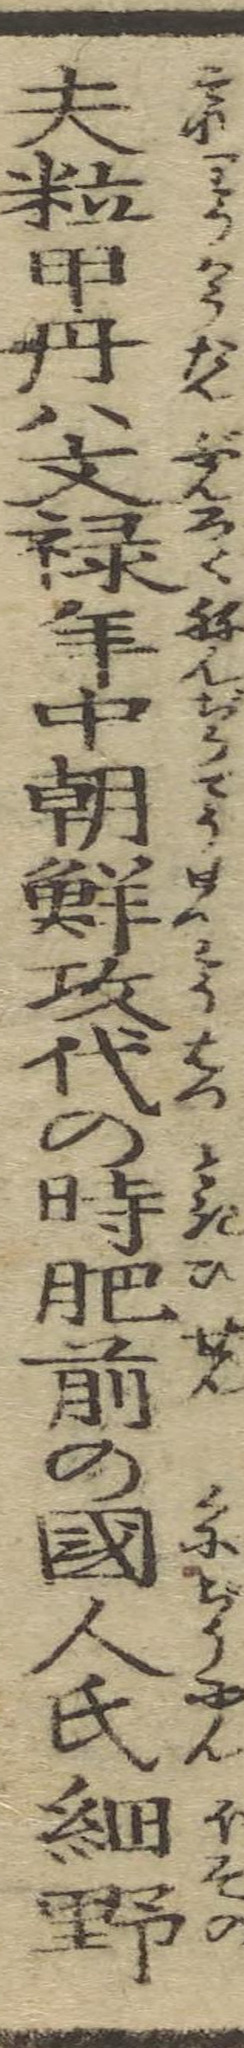夫粒甲丹は文禄年中朝鮮攻代の時肥前の国人氏細野
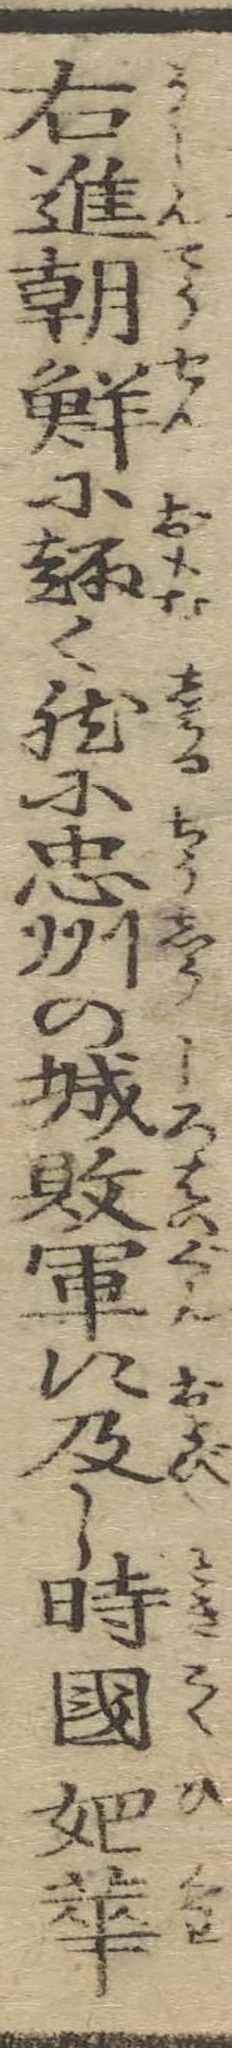右進朝鮮に趣く然に忠州の城敗軍に及し時国妃華
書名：浪華薬種問屋能書張交帖. 二
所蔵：国立国会図書館 National Diet Library, JAPAN
